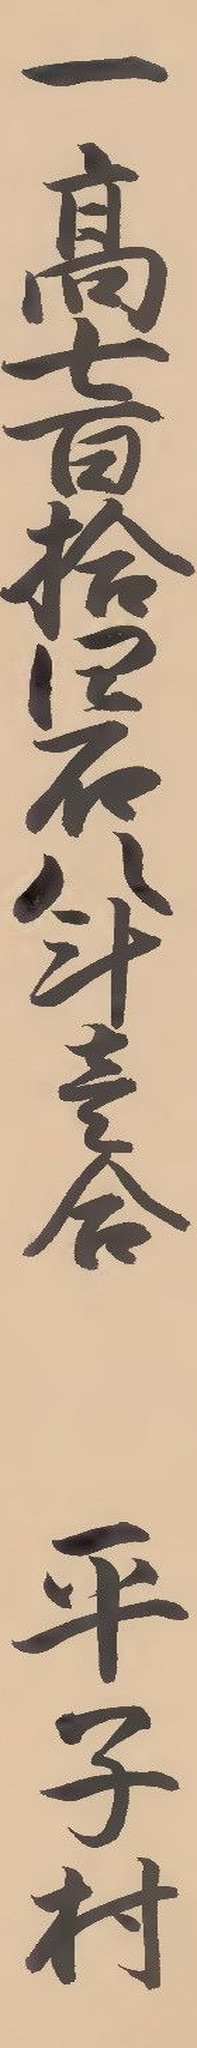一高七百拾四石八斗壱合平子村
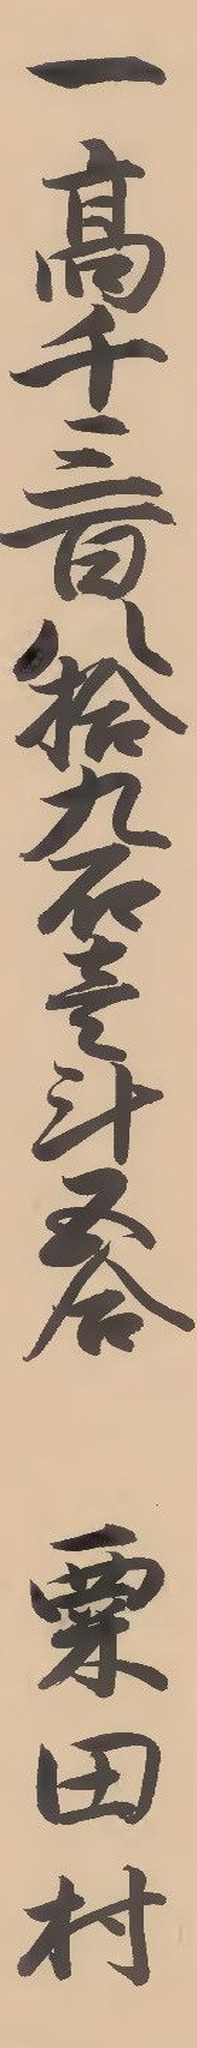一高千三百八拾九石壱斗五合栗田村
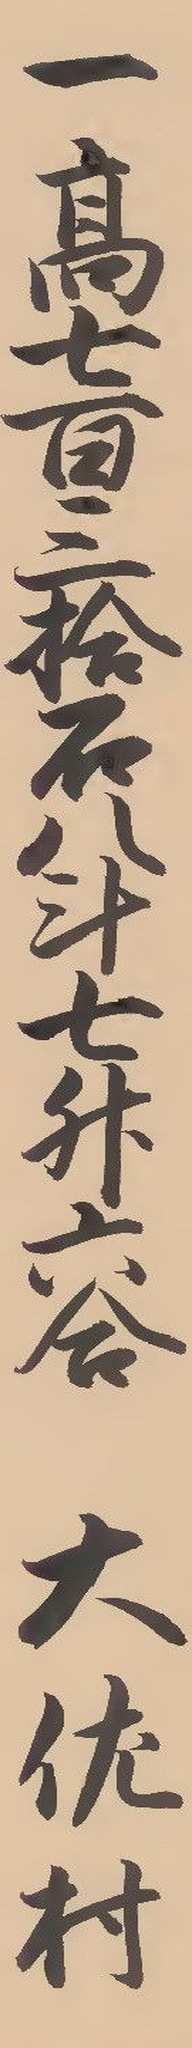一高七百三拾石八斗七升六合大佐村
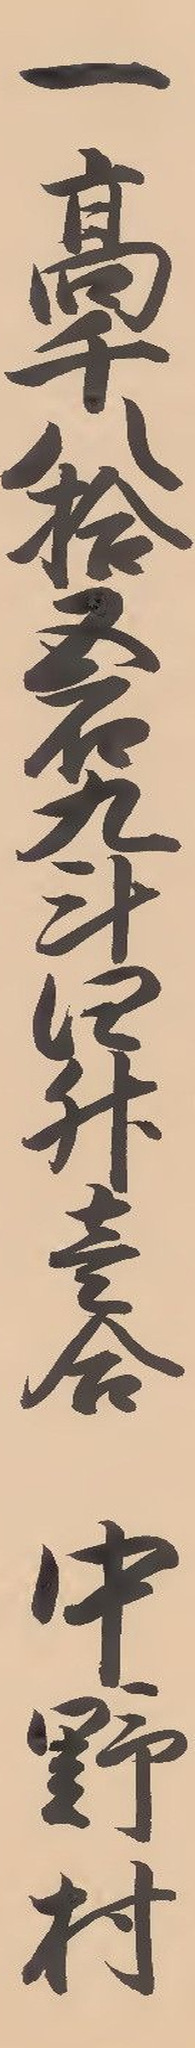一高千八拾五石九斗四升壱合中野村
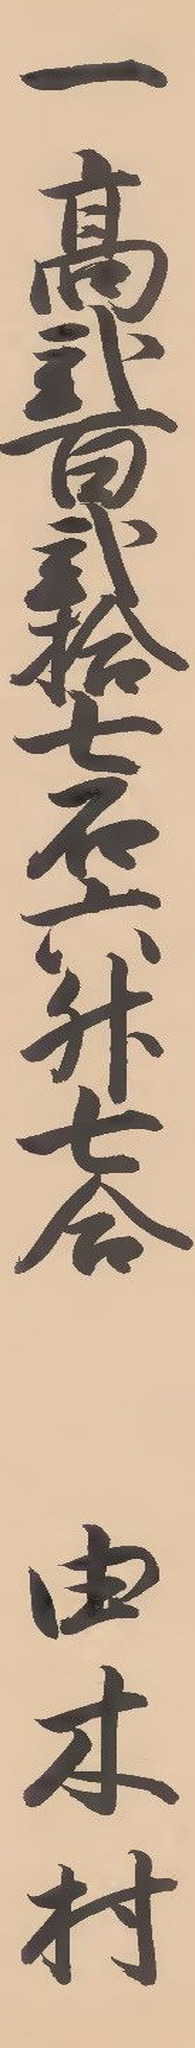一高弐百弐拾七石六升七合由木村
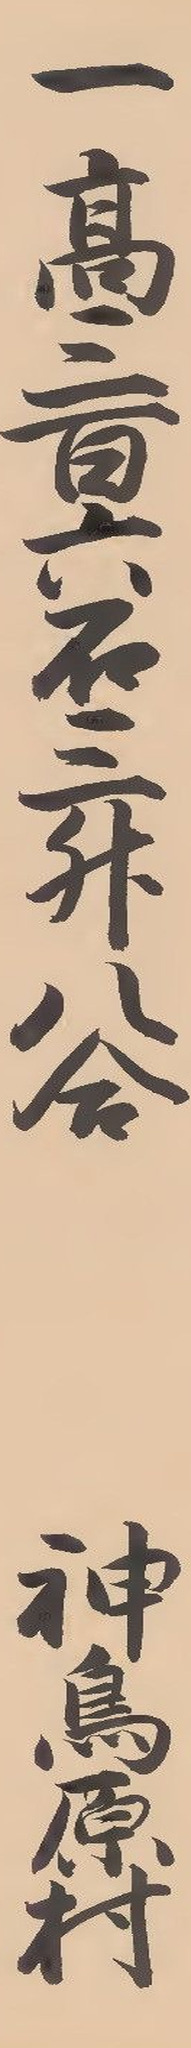一高三百六石三升八合神鳥原村
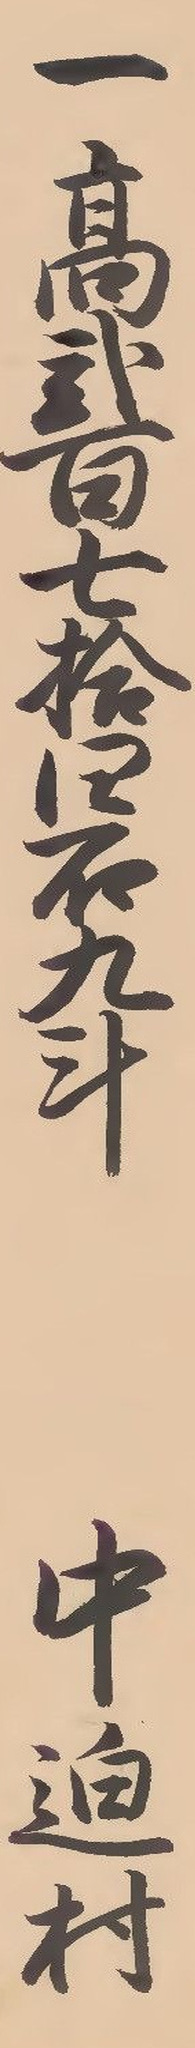一高弐百七拾四石九斗中迫村

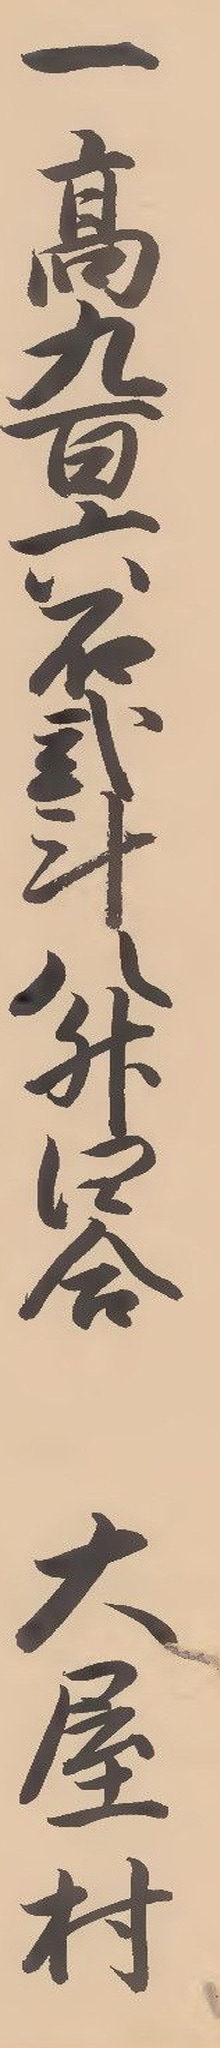一高九百六石弐斗八升四合大屋村
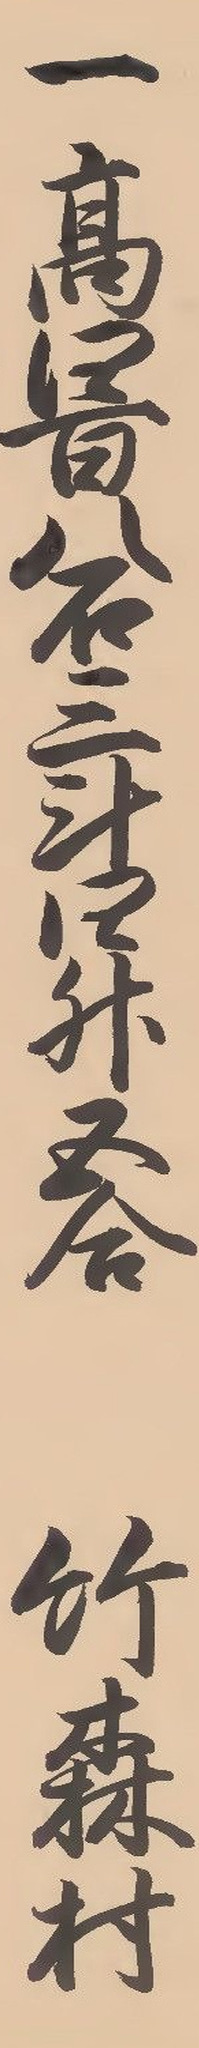一高四百八石三斗四升五合竹森村
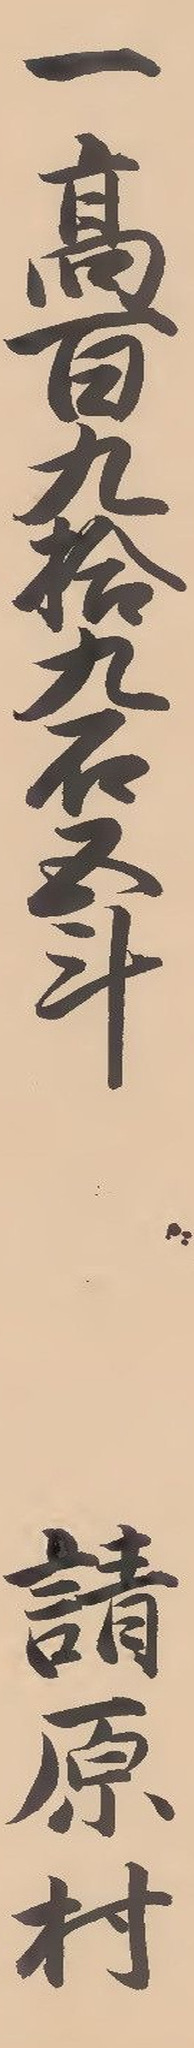一高百九拾九石五斗請原村
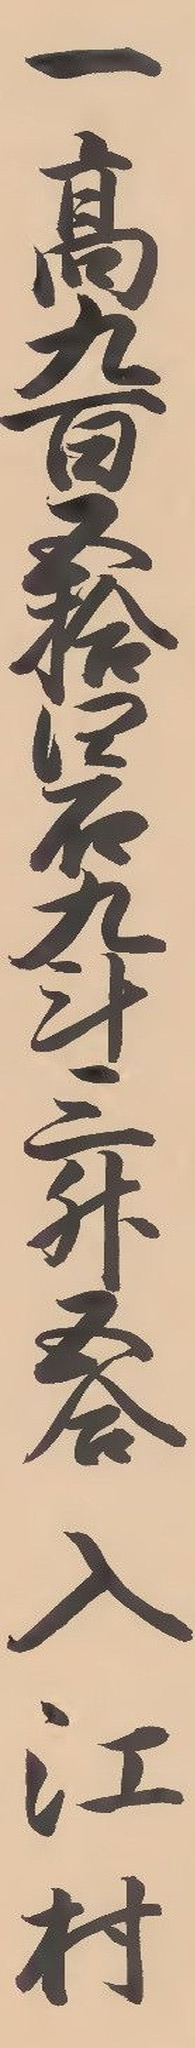一高九百五拾四石九斗三升五合入江村
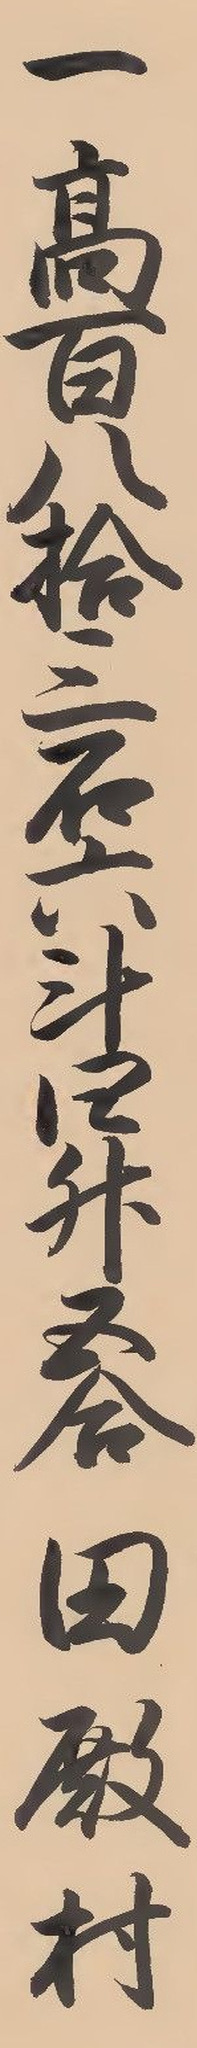一高百八拾三石六斗四升五合田殿村
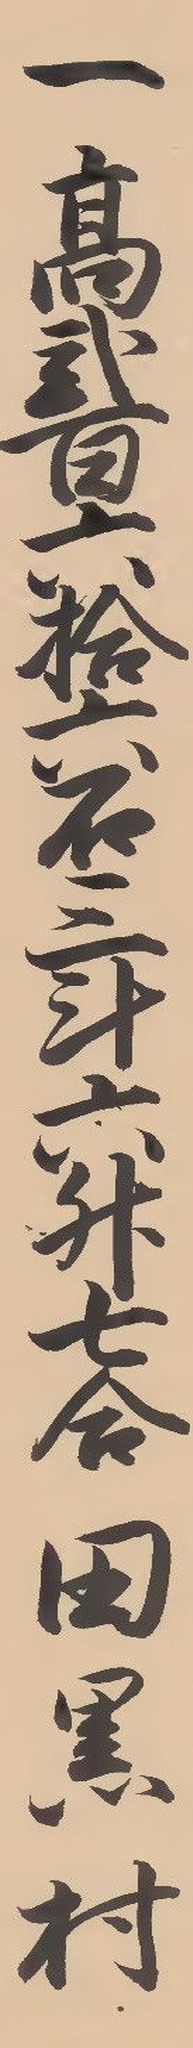一高弐百六拾六石三斗六升七合田黒村
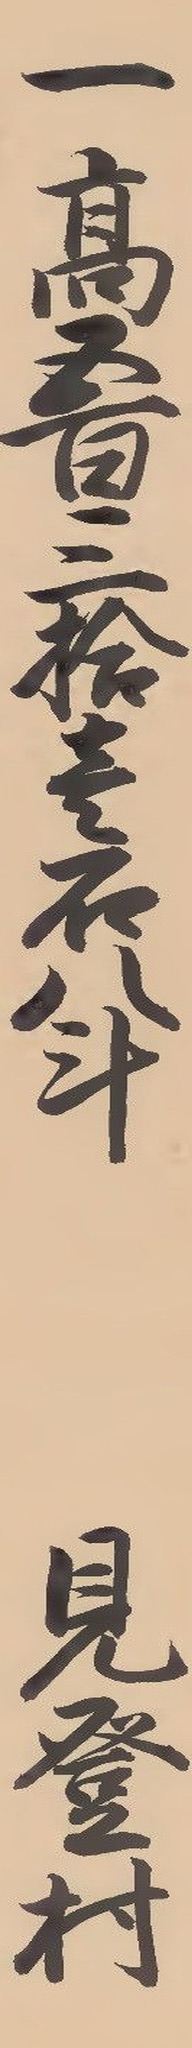一高五百三拾壱石八斗見登村
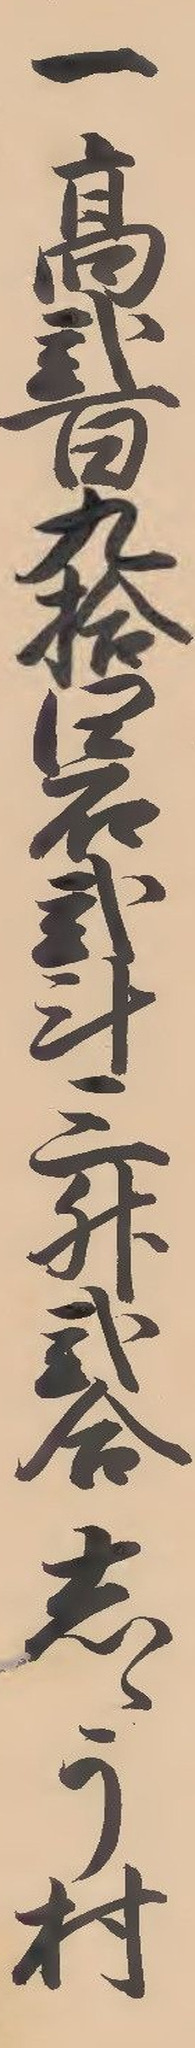一高弐百九拾四石弐斗三升弐合しゝう村

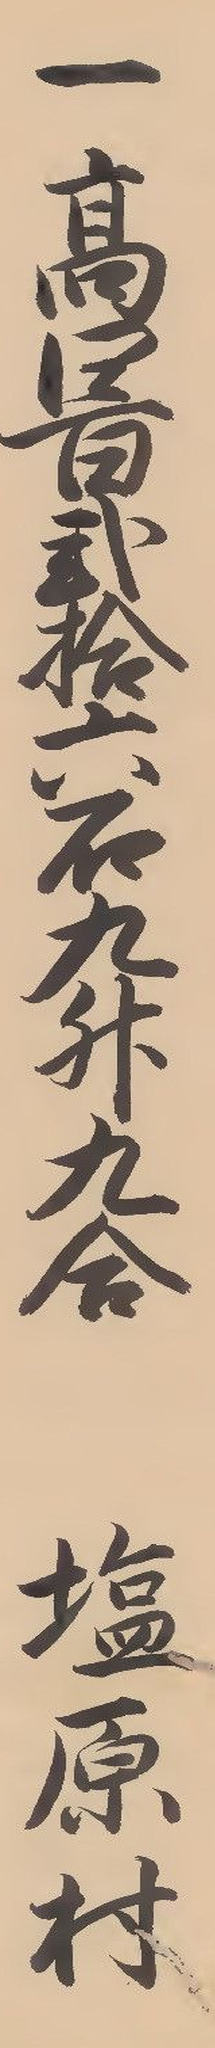一高四百弐拾六石九升九合塩原村
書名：備後国郷帳
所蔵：国立公文書館 National Archives of Japan
